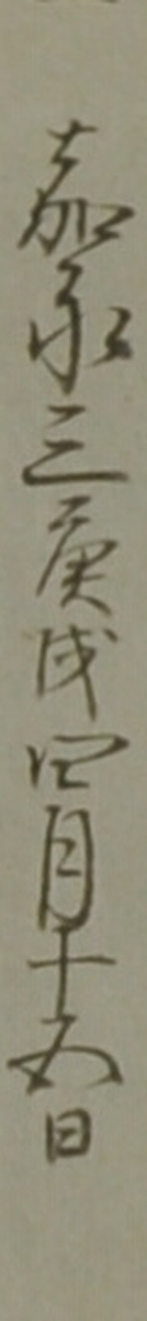一嘉永三庚戌四月十五日

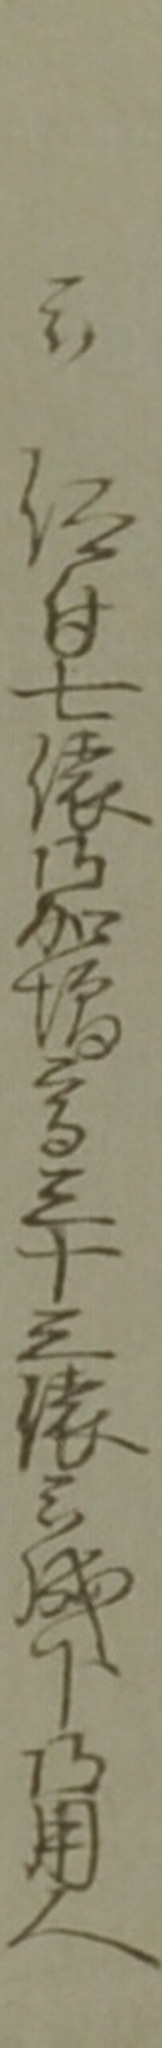被仰付七俵御加増高三十三俵被成下御用人
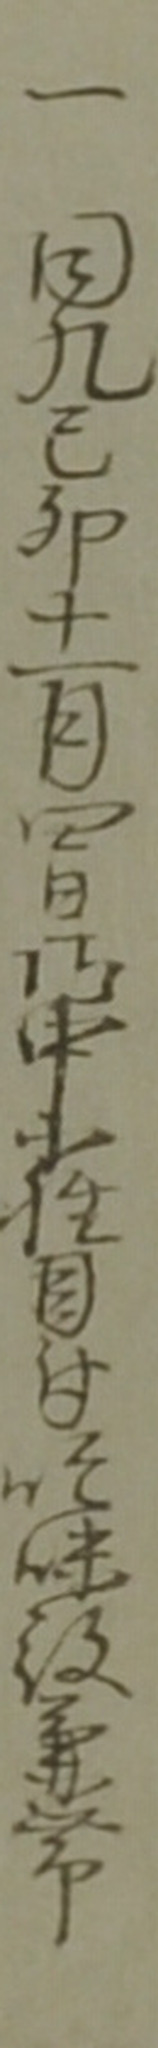一同九己卯十一月四日御中小性目付吟味役兼帯
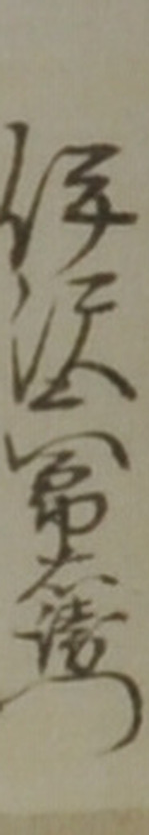伊沢六郎右衛門

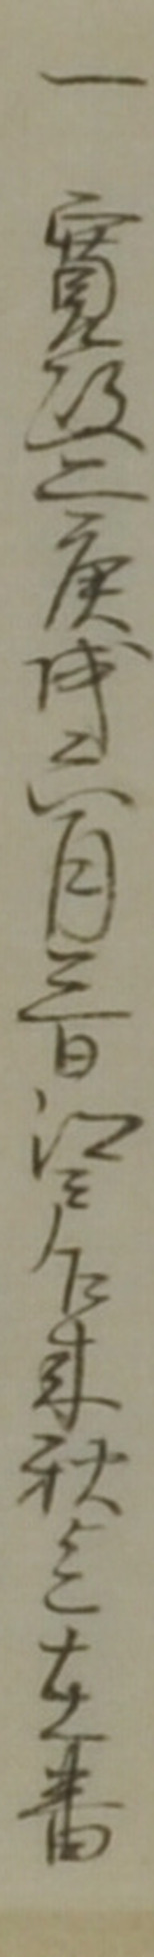一寛政二庚戌六月三日江戸江来秋迄在番

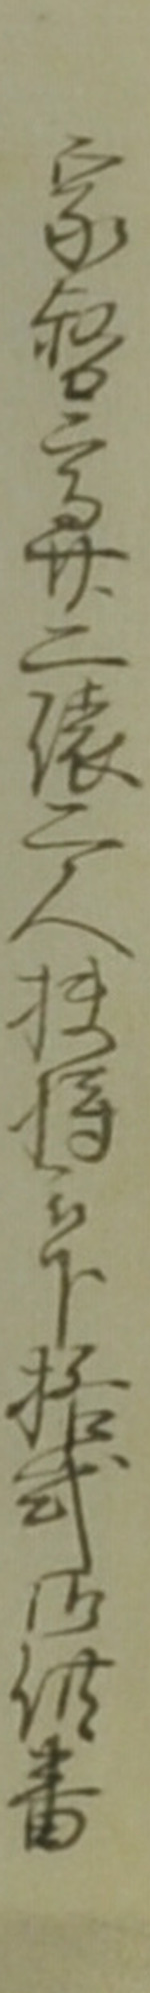家督高廿二俵二人扶持被下格式御供番
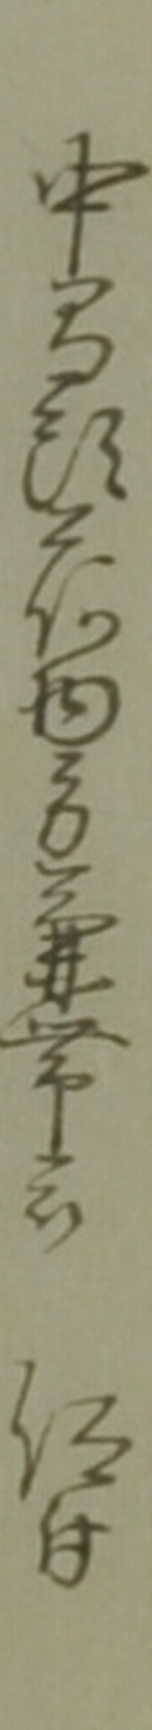中間頭荷物方兼帯被仰付
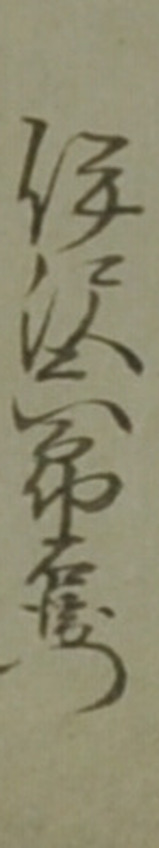伊沢六郎右衛門
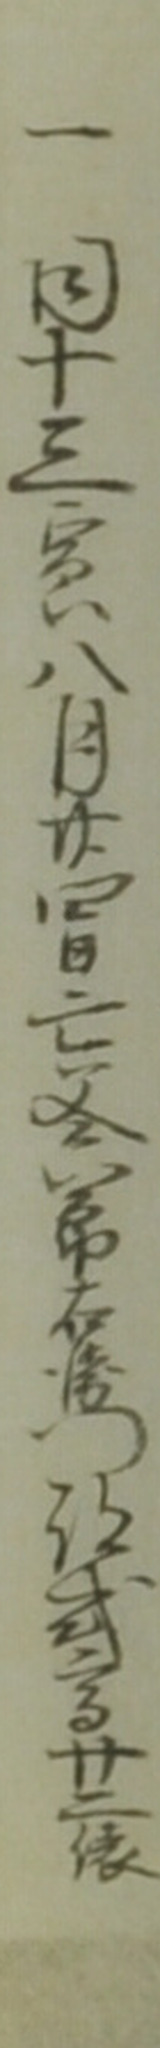一同十三寅八月廿四日亡父六郎右衛門跡式高廿二俵

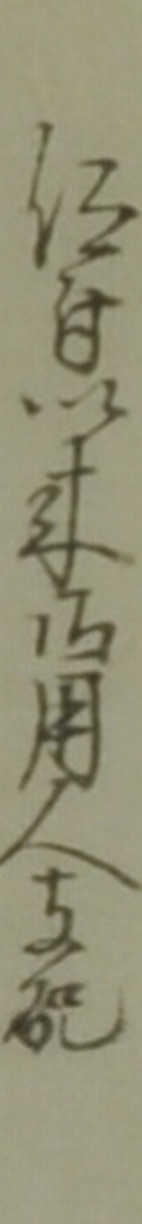仰付以来御用人支配

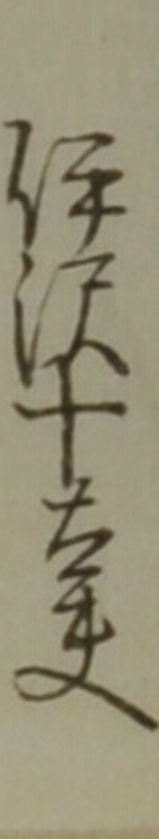伊沢十太夫
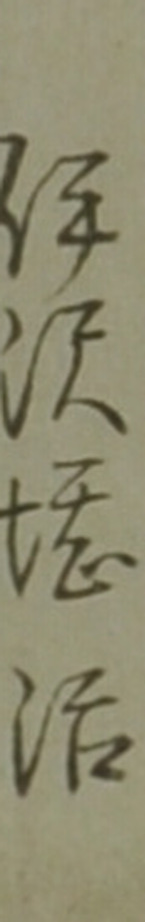伊沢堪治

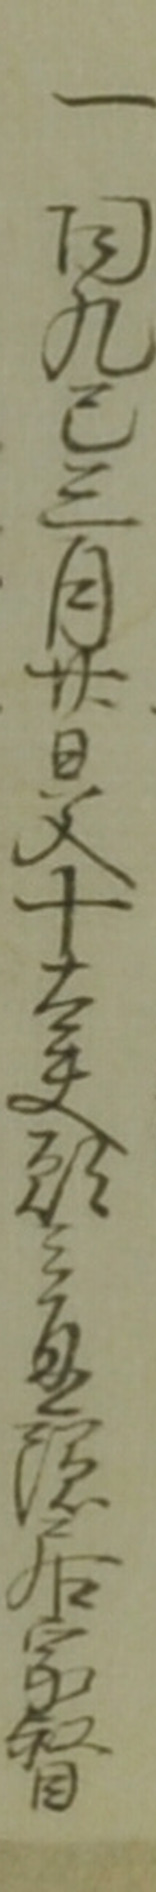一同九巳三月廿日父十太夫願之通隠居家督
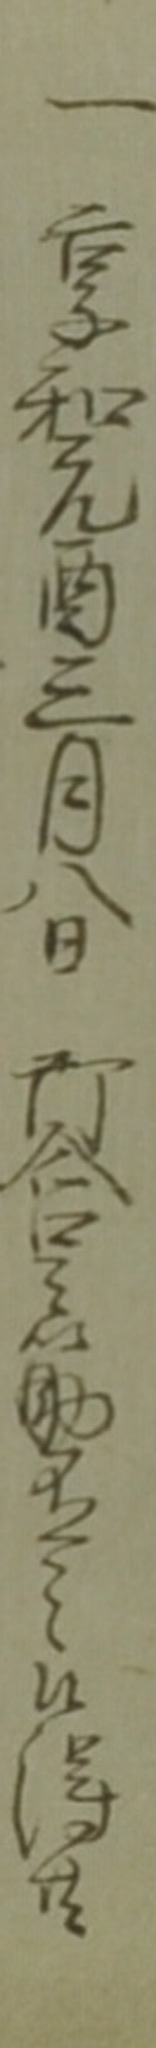一享和元酉三月八日御含之筋有之候得共
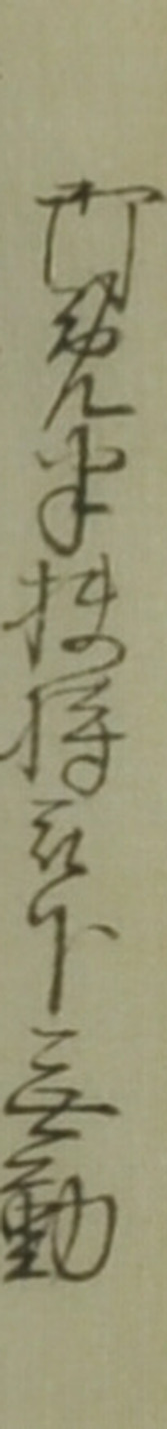御免半扶持被下無勤
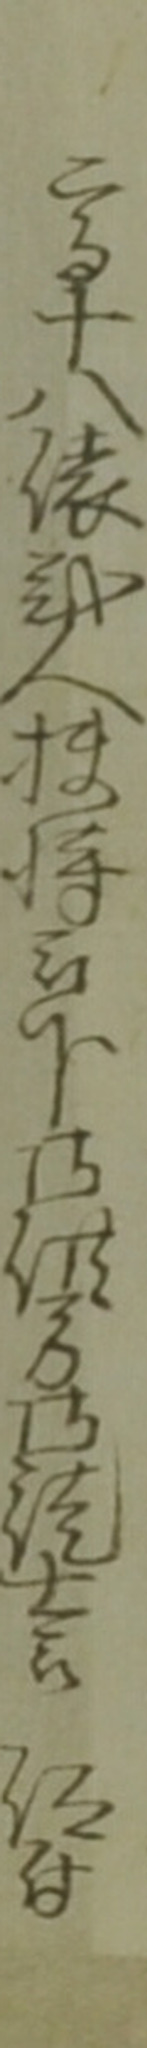高十八俵弐人扶持被下御供方御徒士被仰付
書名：無足諸士勤仕録（三）
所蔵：伊那市立高遠町図書館・合同会社AMANE
